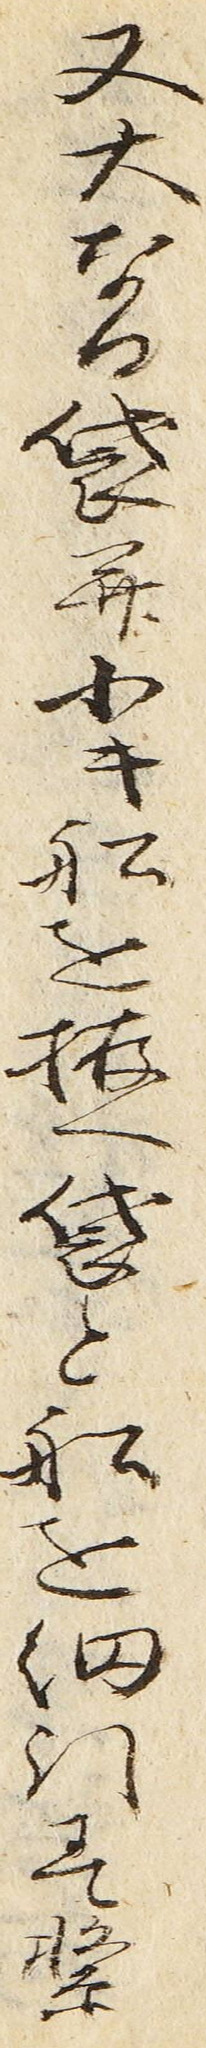又大なる袋并小キ船を拵へ袋と船を細引にて繋
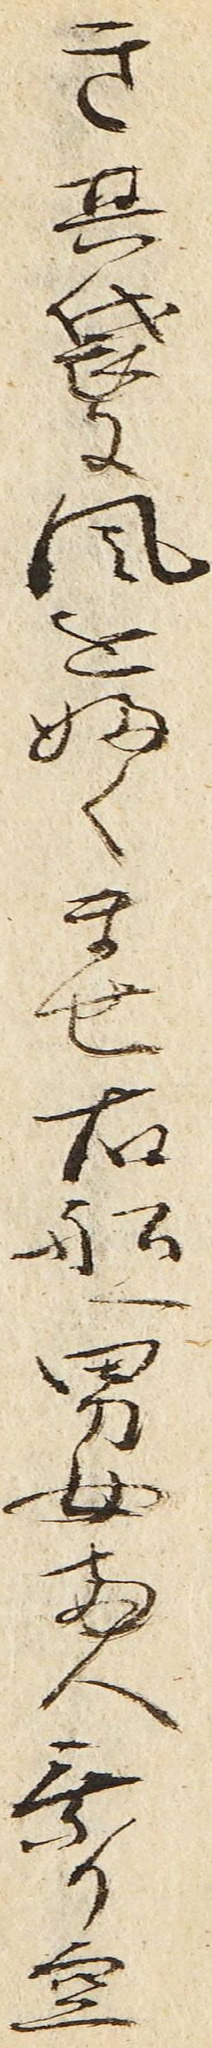き其袋に風をふくませ右船へ男女両人乗り空
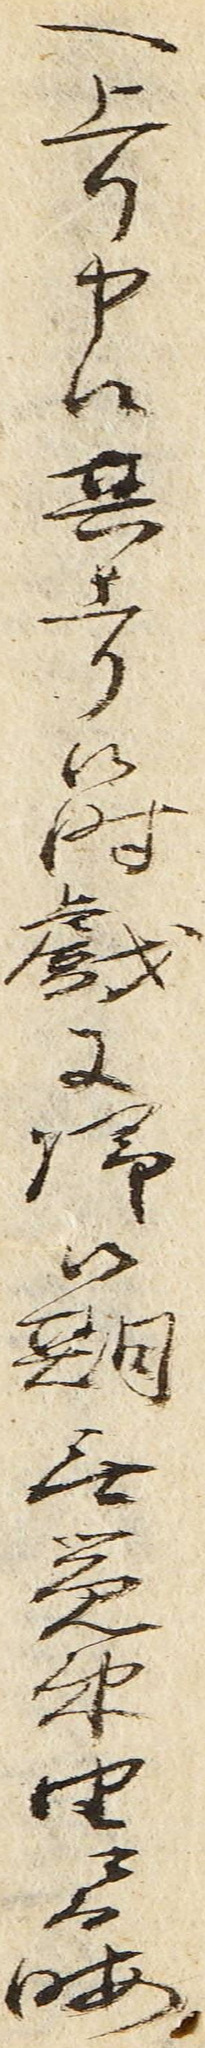へ上り申候其上り候時戯に帰候期無覚束由にて暇
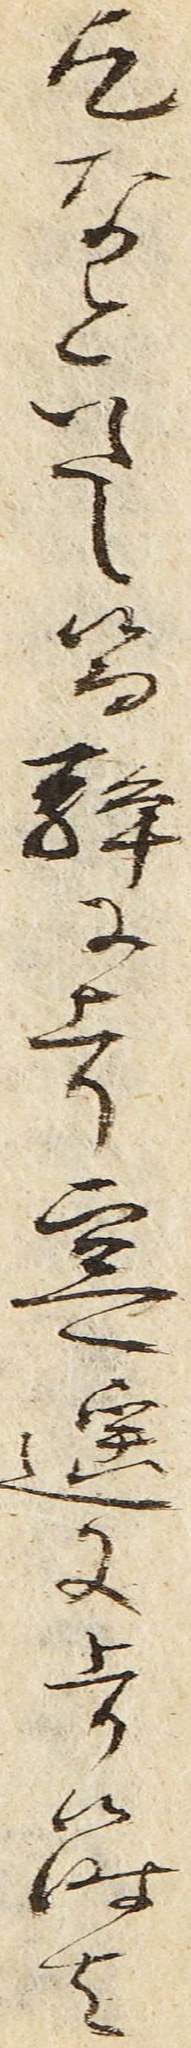乞なといたし候て静に上り空へ遥に上り候時は
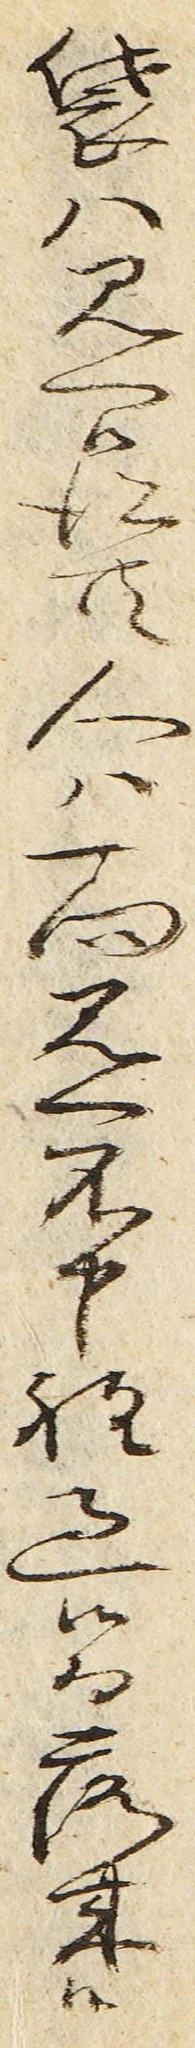袋は見へ候得共人は一向見へ不申程過候てお落来候
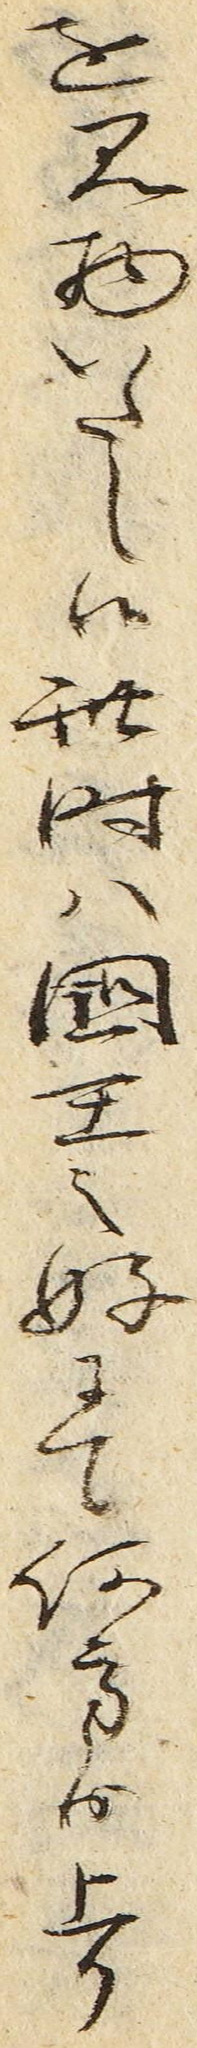を見物いたし候此時は国王之好にて何方ゟ上り

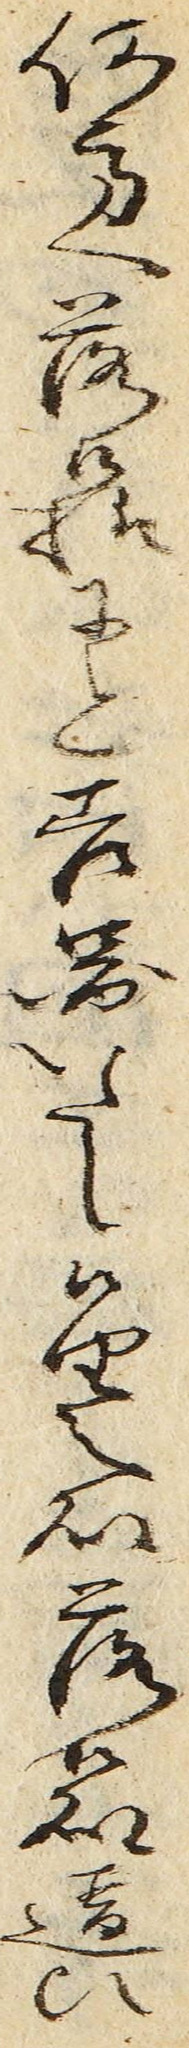何方へ落候様にと差図いたし候由之処落候処違ひ
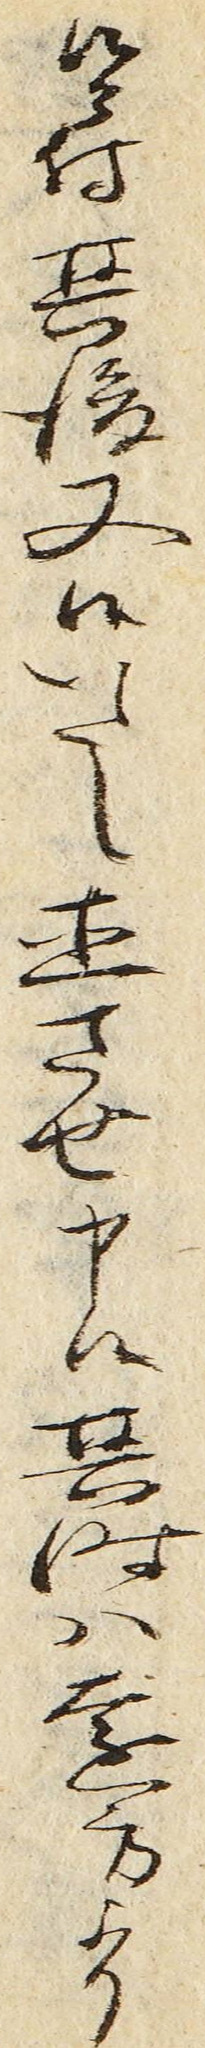候に付其後又候いたし直させ申候其時は遠方より
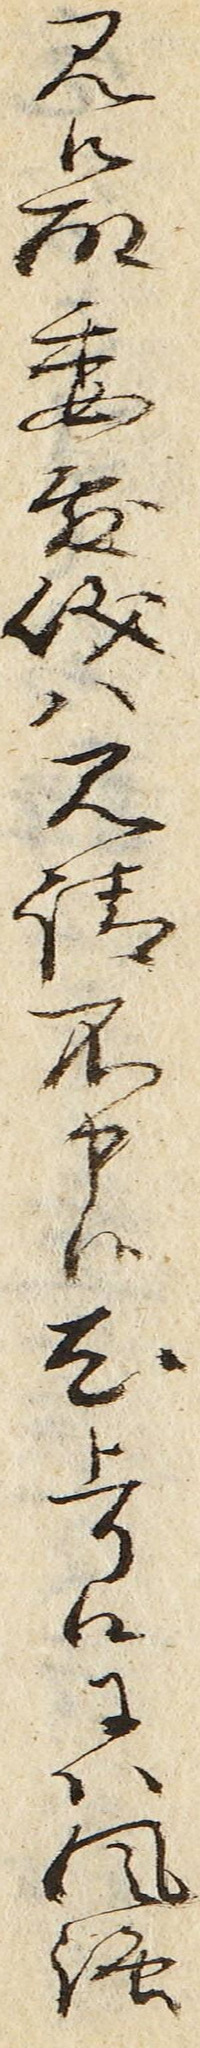見候故委敷儀は見請不申候尤上り候には風強
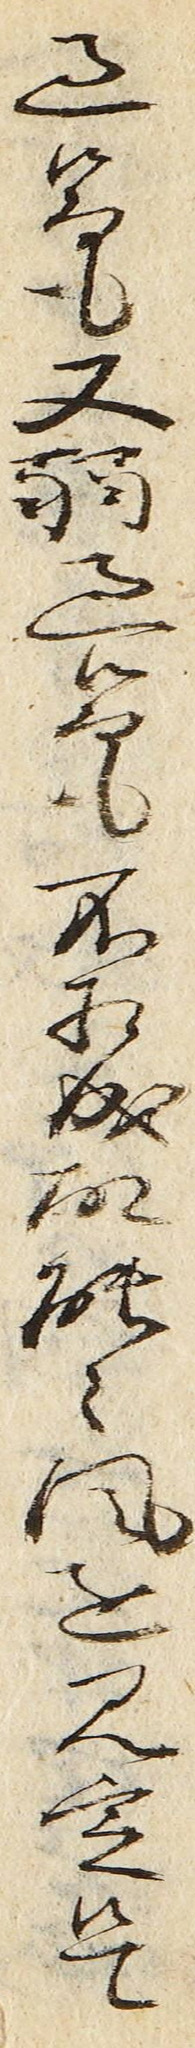過候ても又弱過候ても不相成故能々風を見定候て
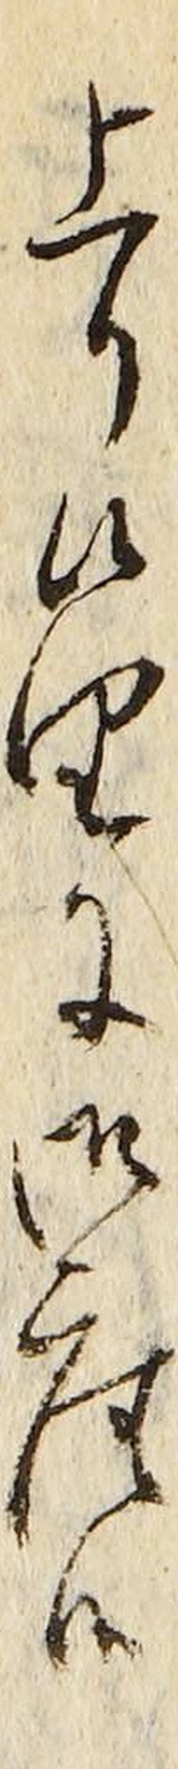上り候由に御座候
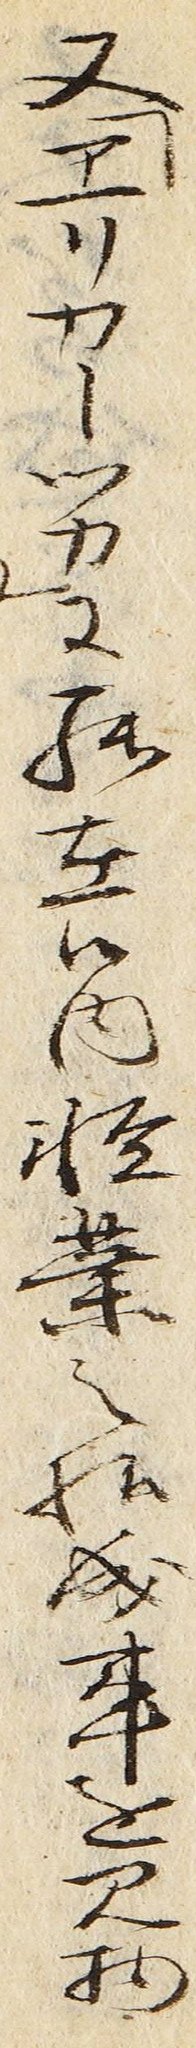又「ヱリカーツカ」に罷在候内軽業之様成事を見物
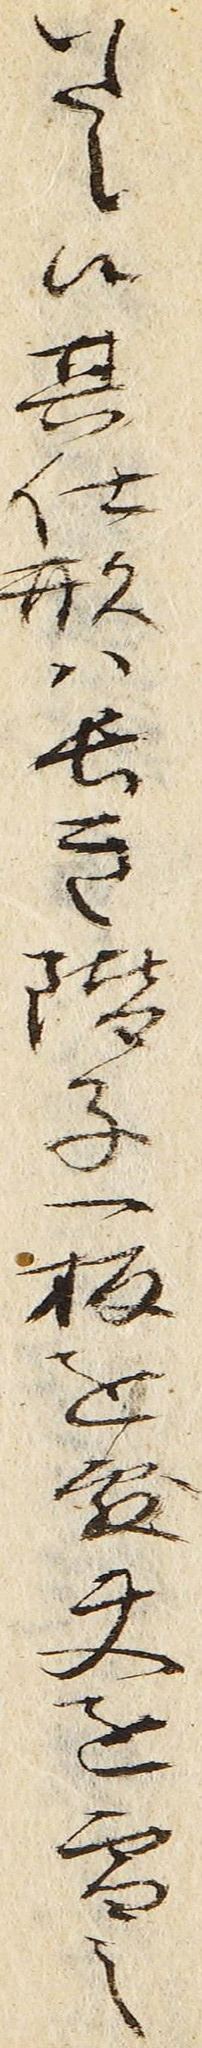いたし候其仕形は長き階子一板を敷夫を雪之
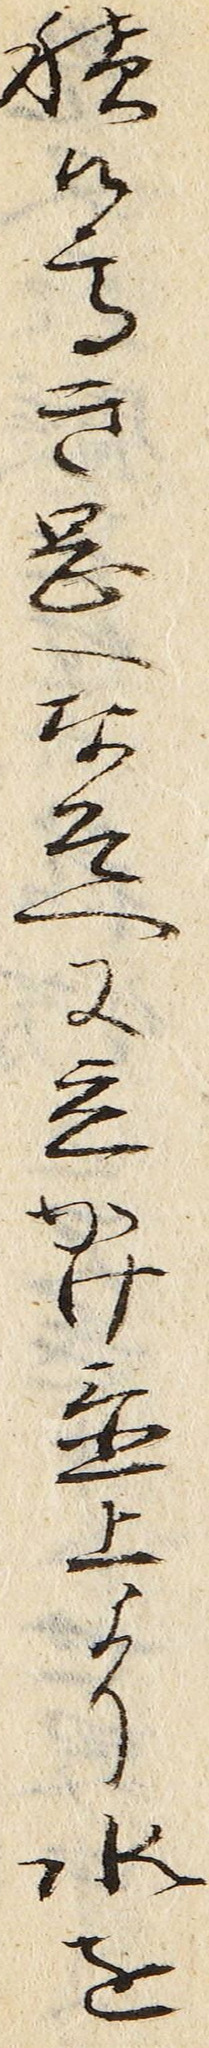積候高き岡へなそへに立かけ置上より水を
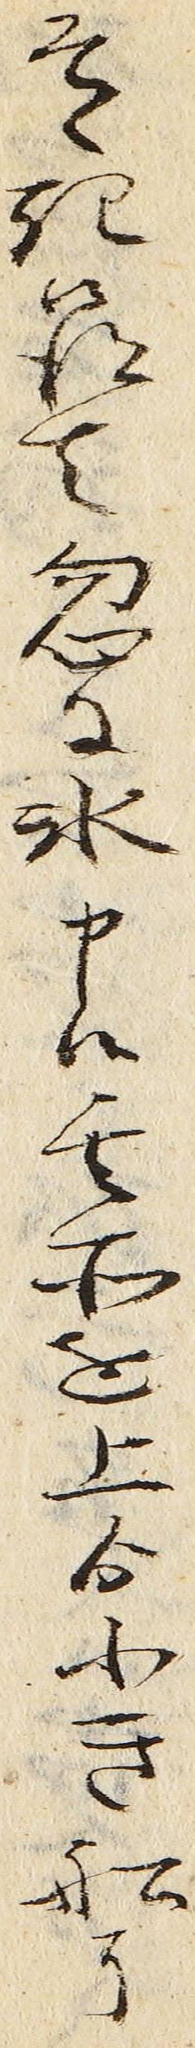そゝき候得は忽に氷申候其所を上ゟ小き船に
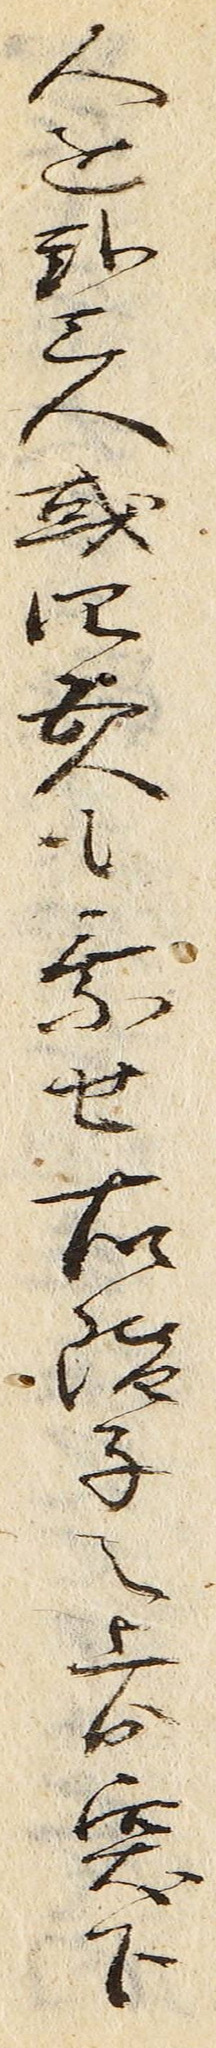人を弐三人或四五人も乗せ右階子之上ゟ突下
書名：漂民後記
